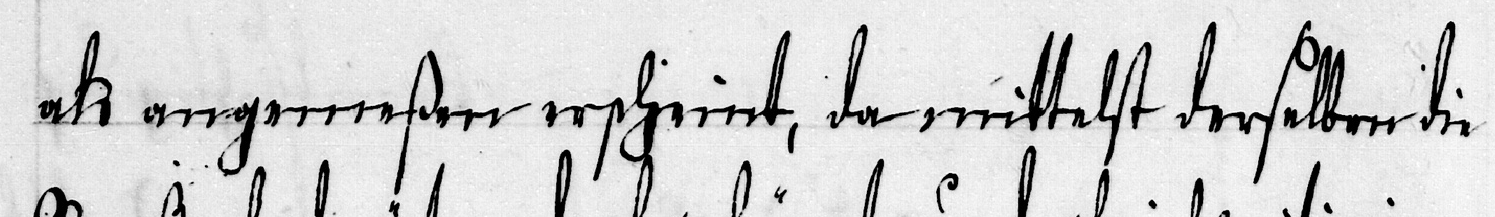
als angemeßen erscheint, da mittelst derselben die
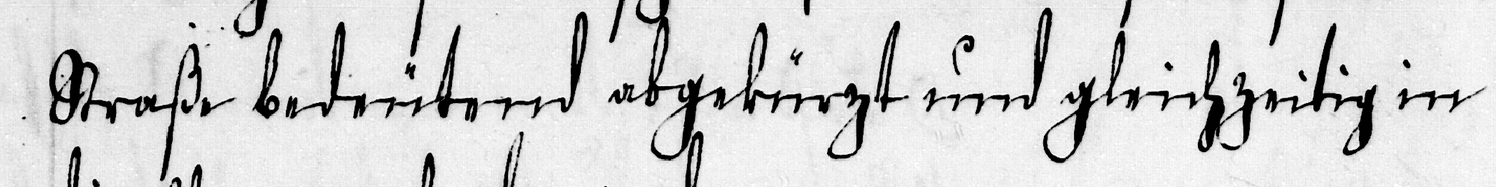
Straße bedeutend abgekürzt und gleichzeitig in
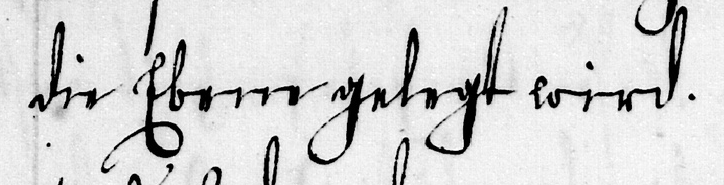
die Ebene gelegt wird.
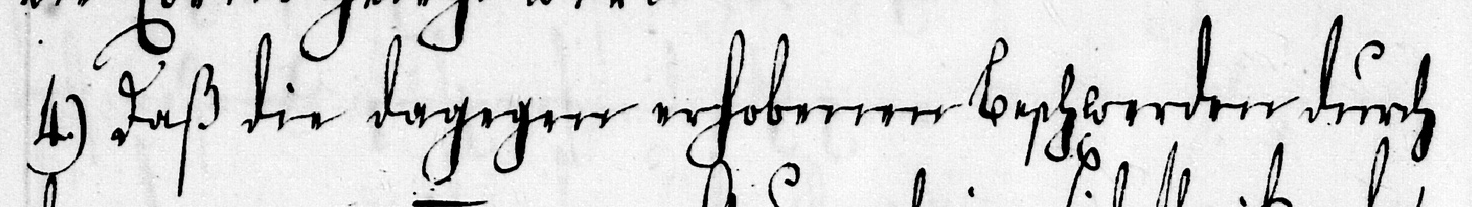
4.) Daß die dagegen erhobenen Beschwerden durch
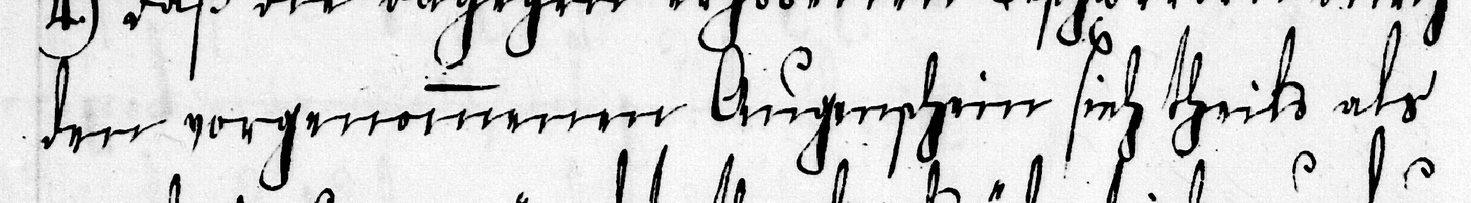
den vorgenommenen Augenschein sich theils als
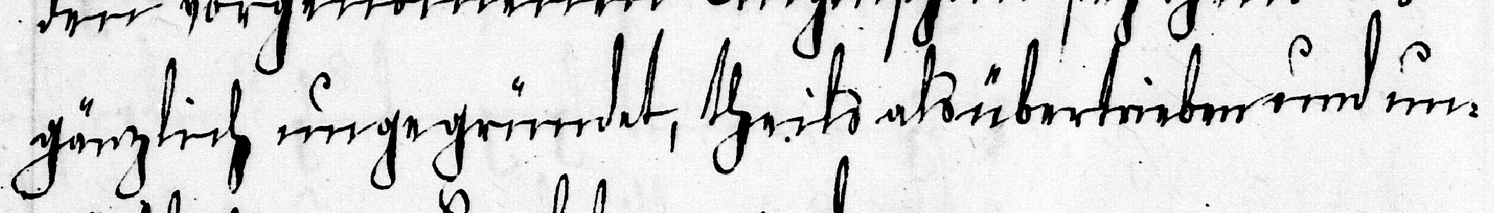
gänzlich ungegründet, theils als übertrieben und un¬
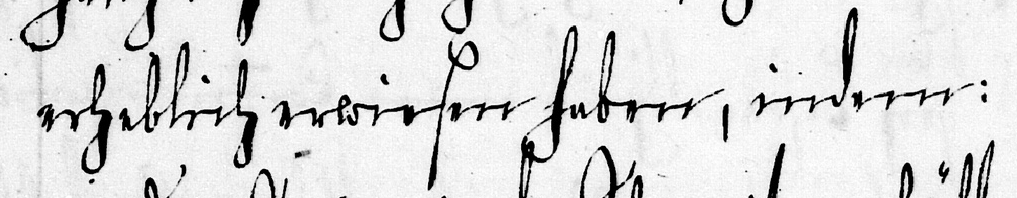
erheblich erwiesen haben, indem:
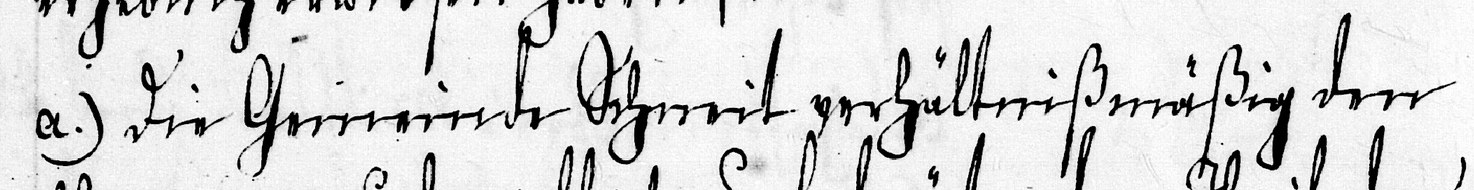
a.) Die Gemeinde Schneit verhältnißmäßig den
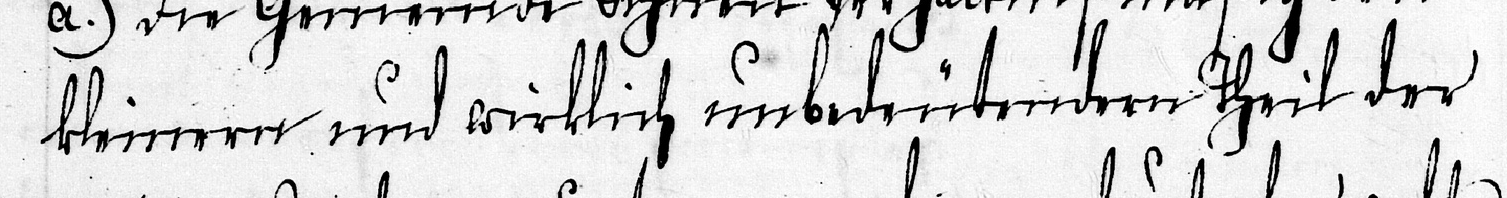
kleinern und wirklich unbedeutendern Theil der
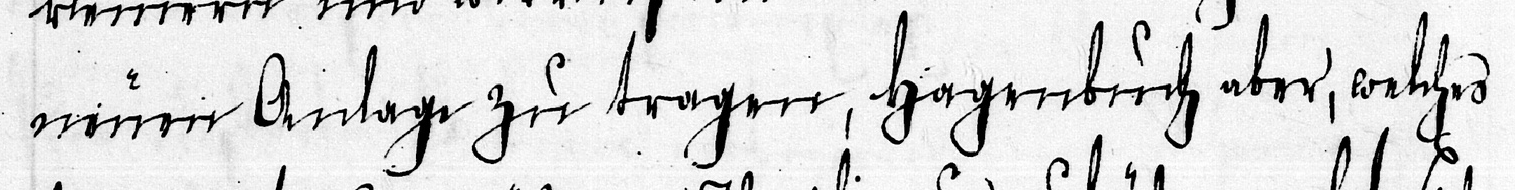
neuen Anlage zu tragen, Hagenbuch aber, welches
